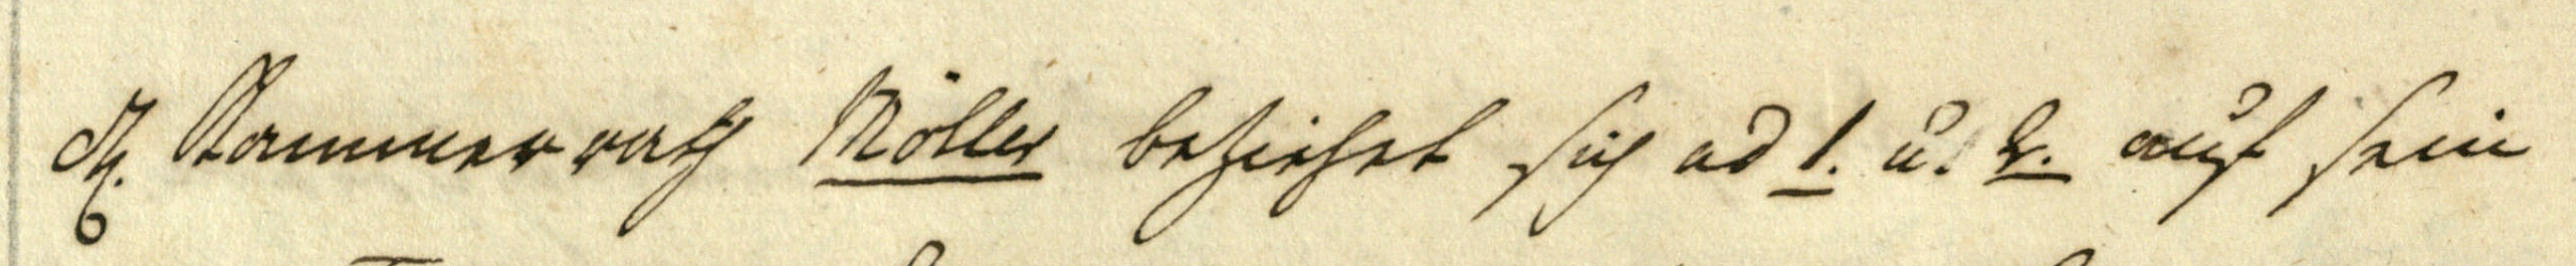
dh. Kammerrath Möller beziehet sich ad 1. u. 2. auf sein
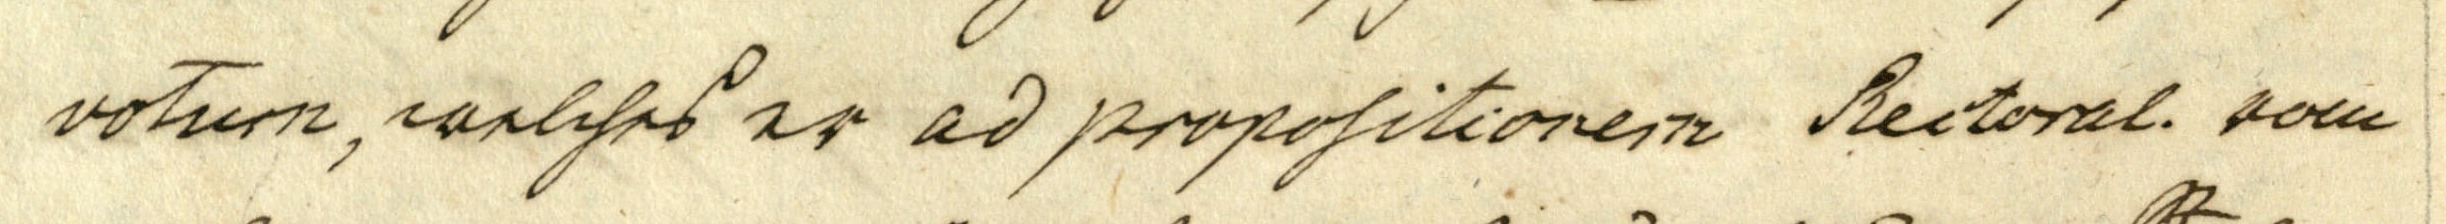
votum, welches er ad propositionem Rectoral. vom
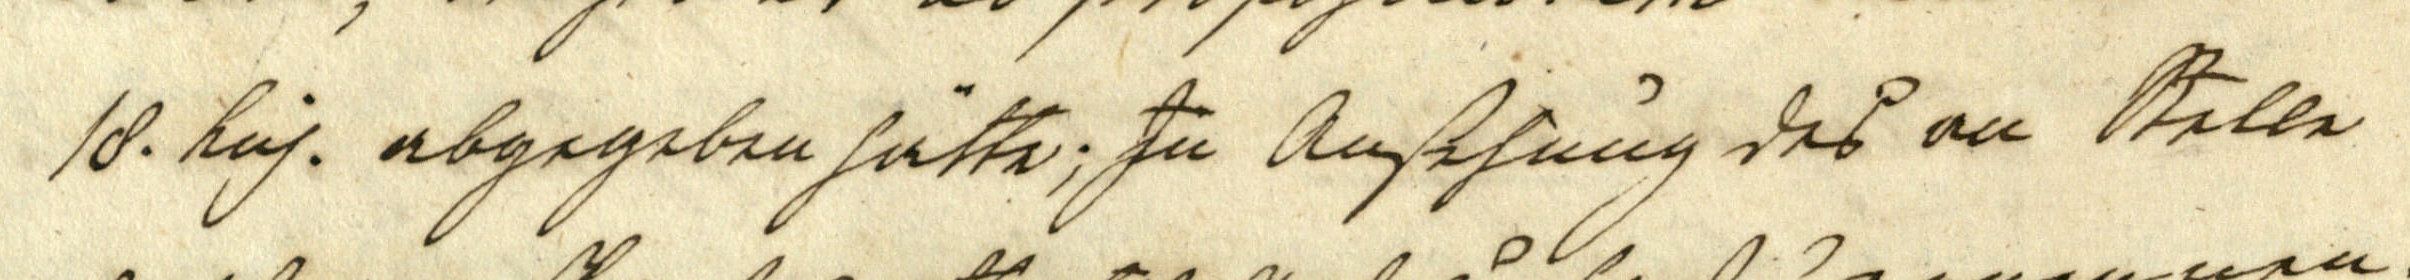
18. huj. abgegeben hätte; In Ansehung des an Stelle
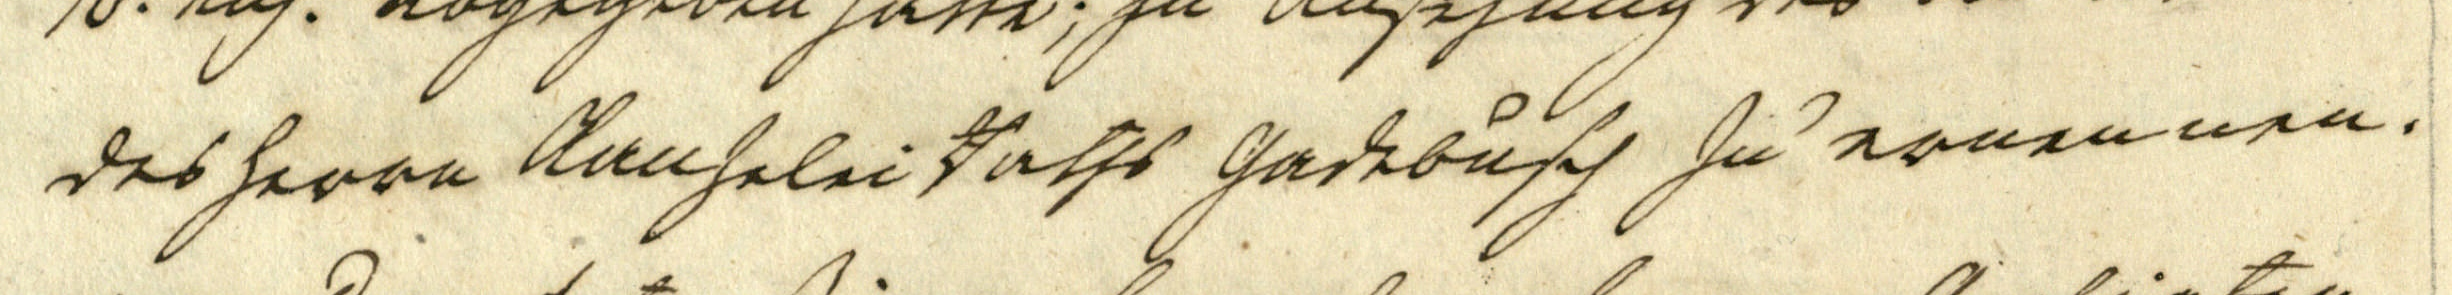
des Herrn Kanzelei Rath s Gadebusch zu ernennen¬
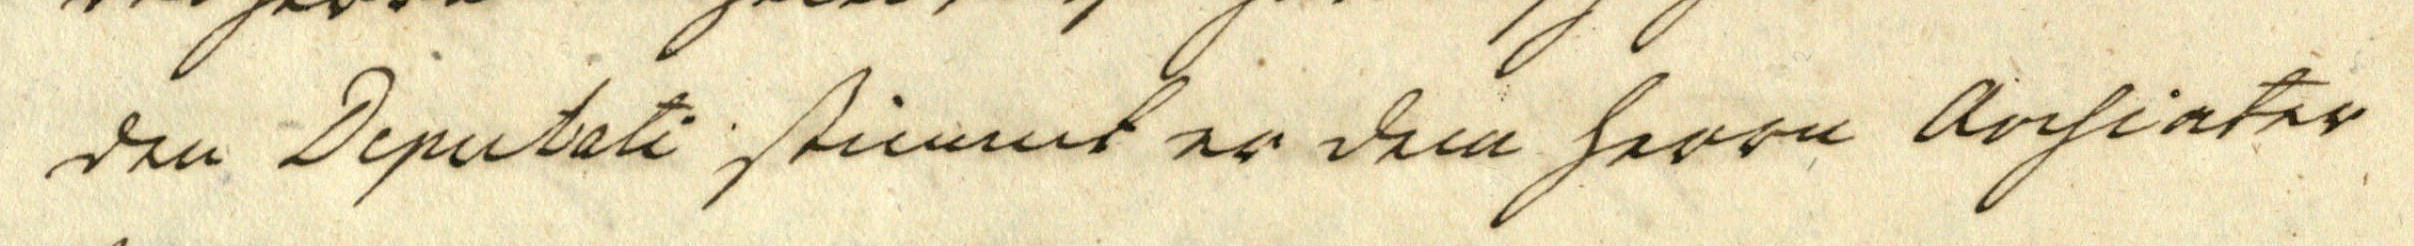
den Deputati stimmt er dem Herrn Archiater
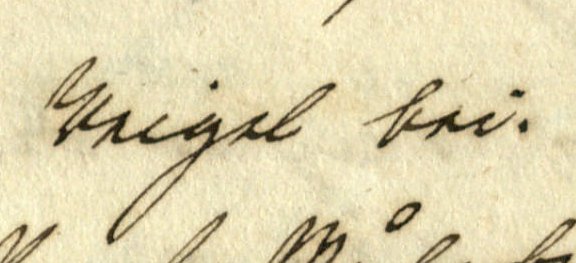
Weigel bei.
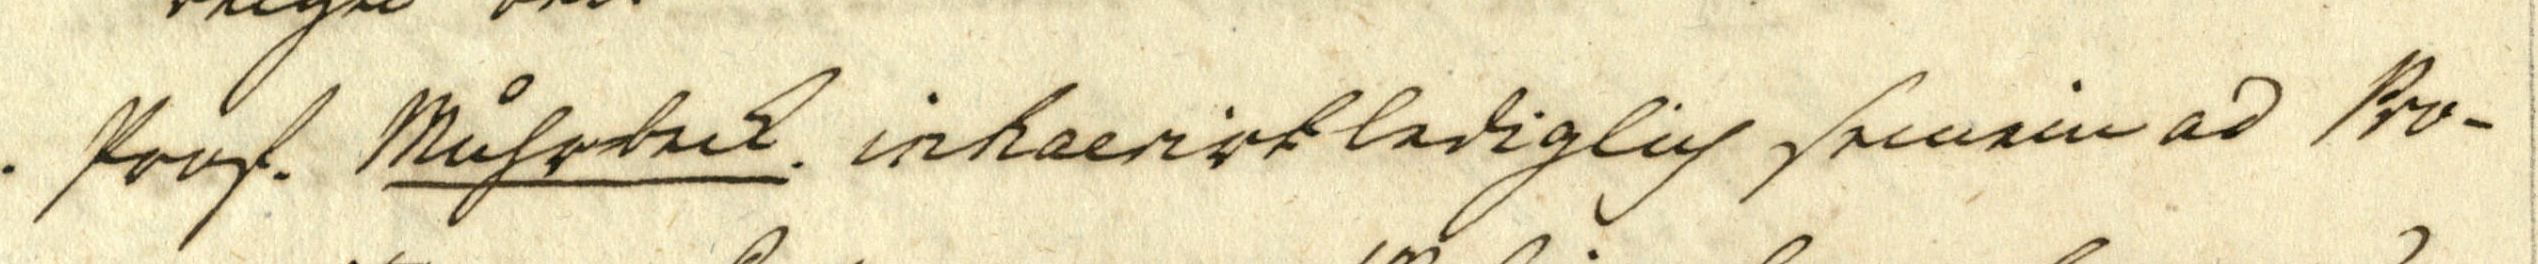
Prof. Muhrbeck inhaerirt lediglich seinem ad Pro
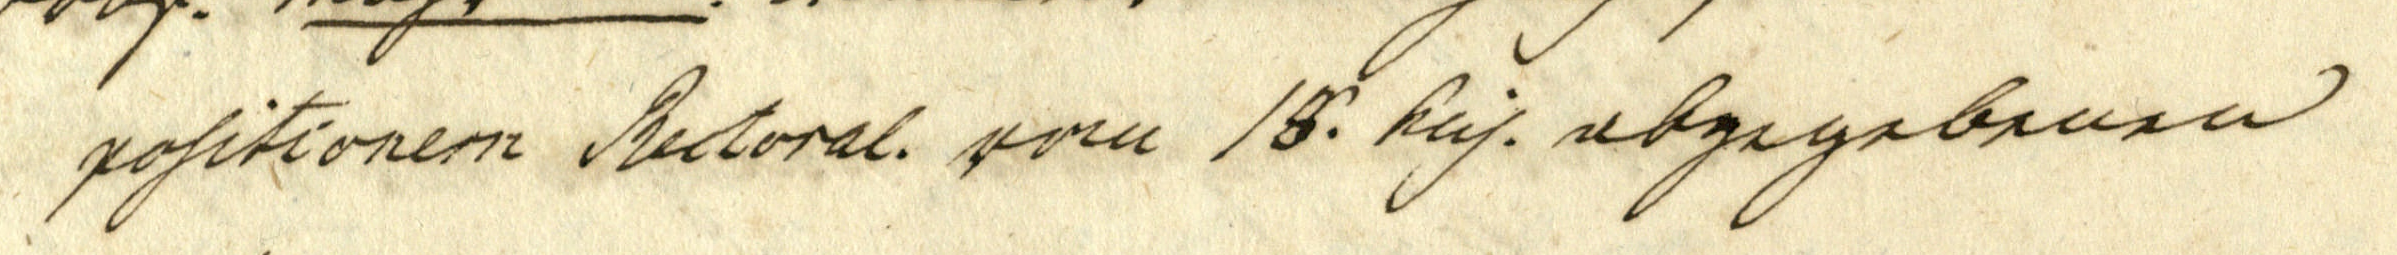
positionem Rectoral. vom 18. huj. abgegebenen
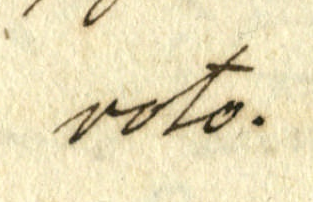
voto.
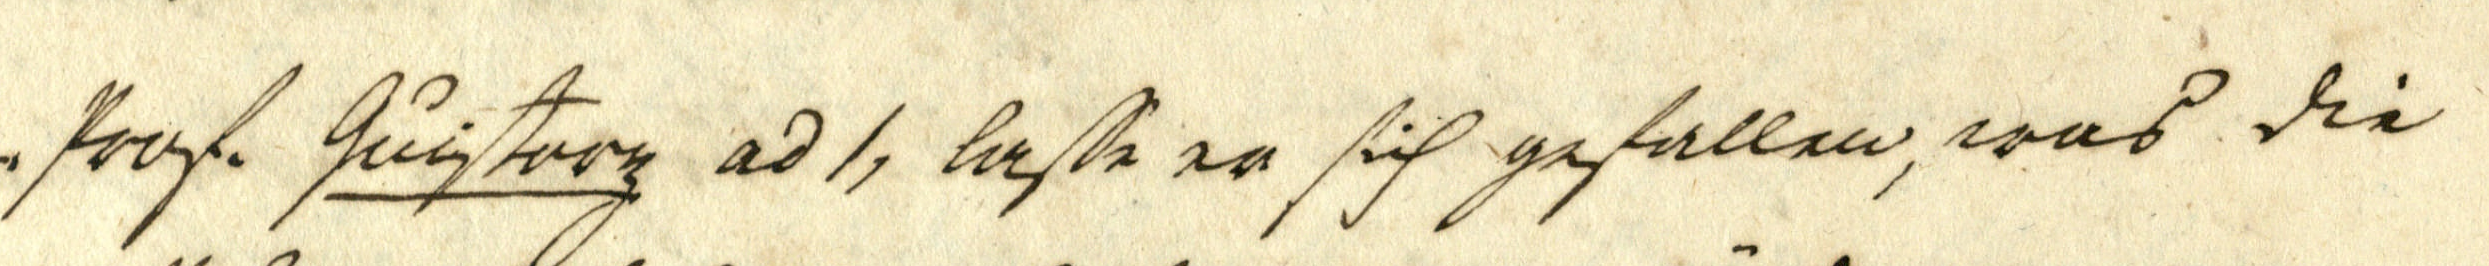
Prof. Quistorp ad 1, lasse er sich gefallen, was die
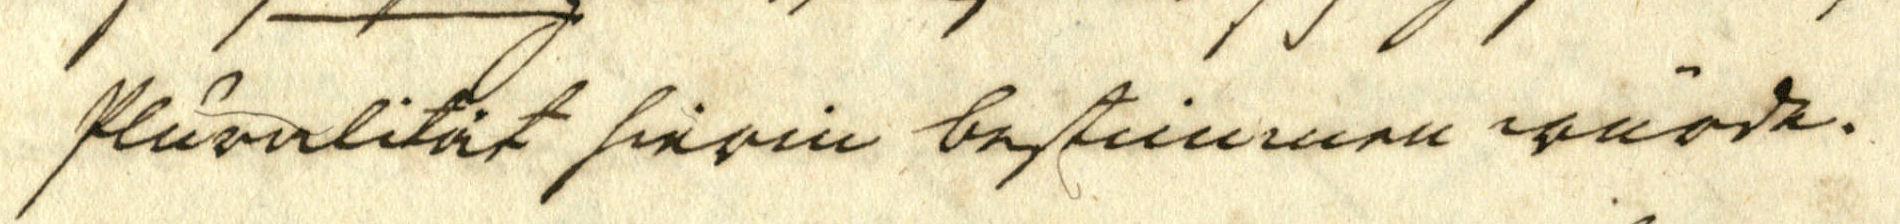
Pluralität hierin bestimmen würde.
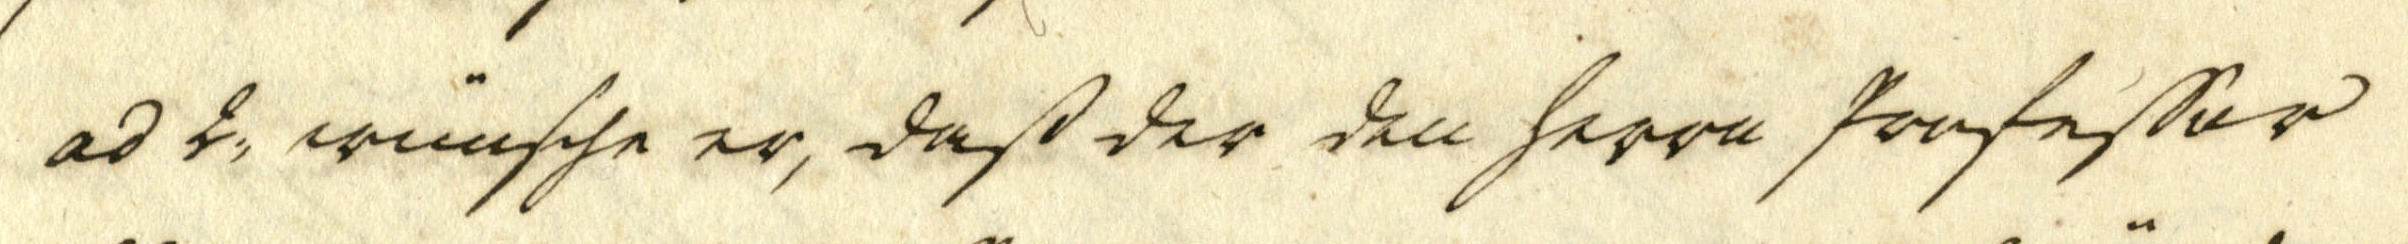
ad 2., wünsche er, daß der den Herrn Professor
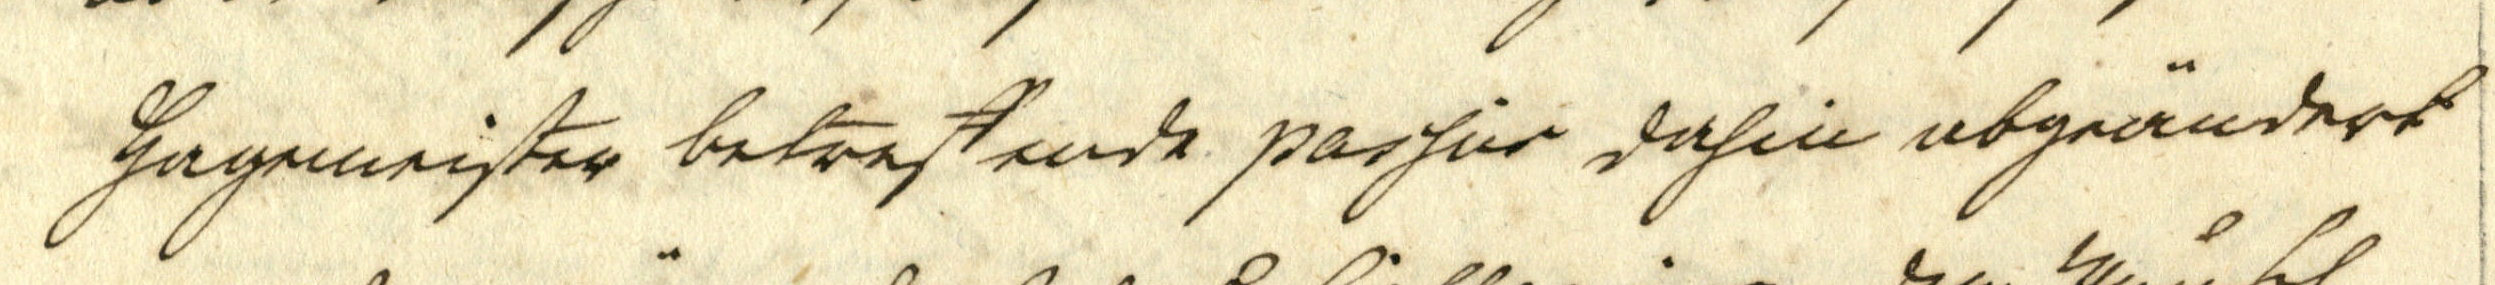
Hagemeister betreffende passus dahin abgeändert
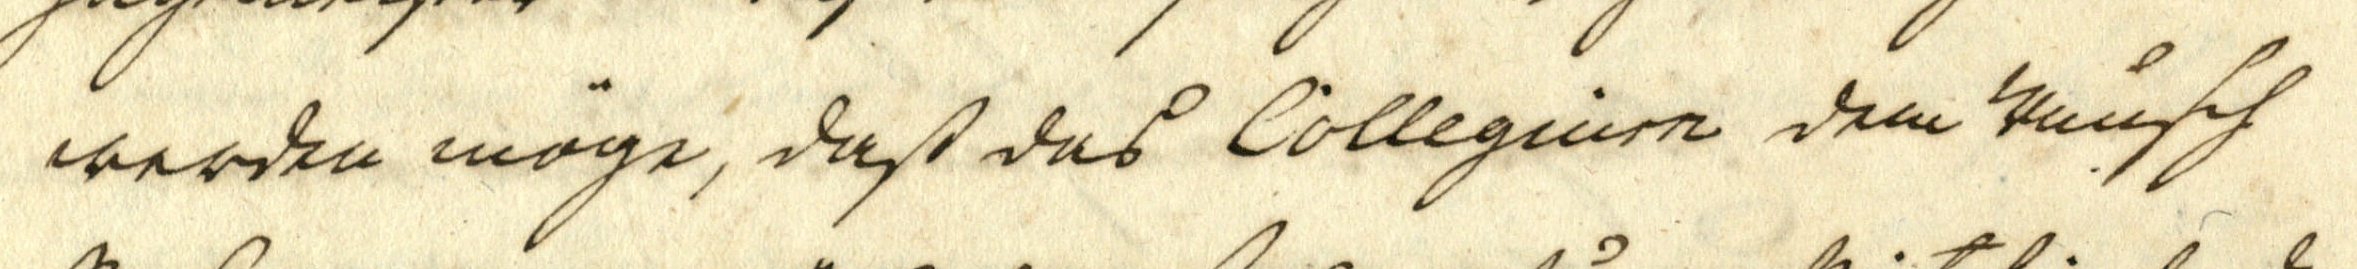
werden möge, daß das Collegium dem Wunsch
